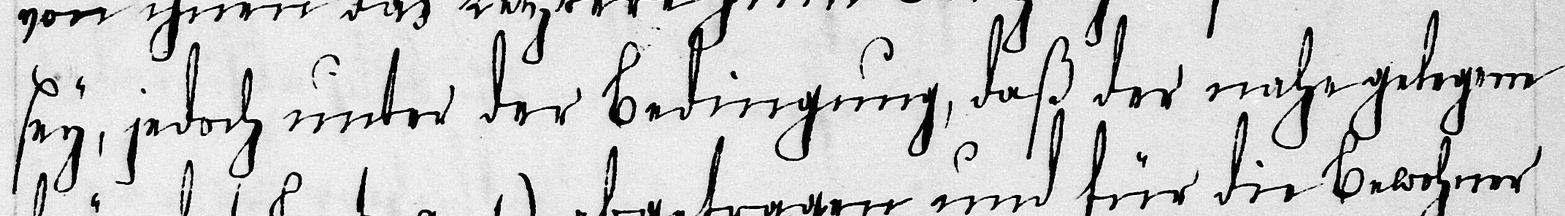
sey, jedoch unter der Bedingung, daß der nahe gelegene
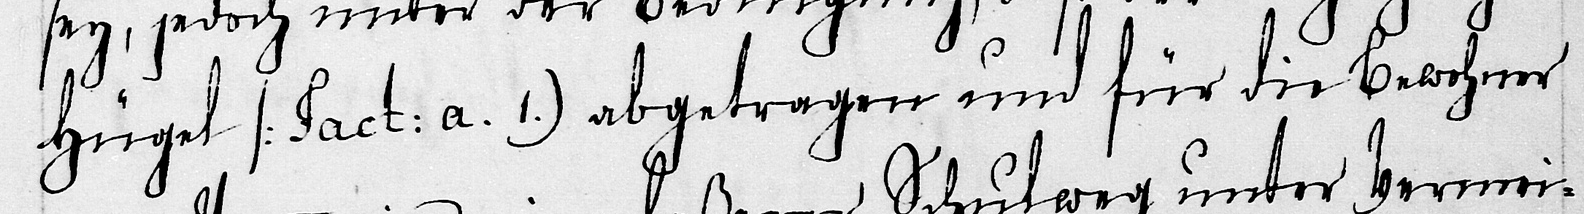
Hügel [Fact: a. 1.] abgetragen und für die Bewohner
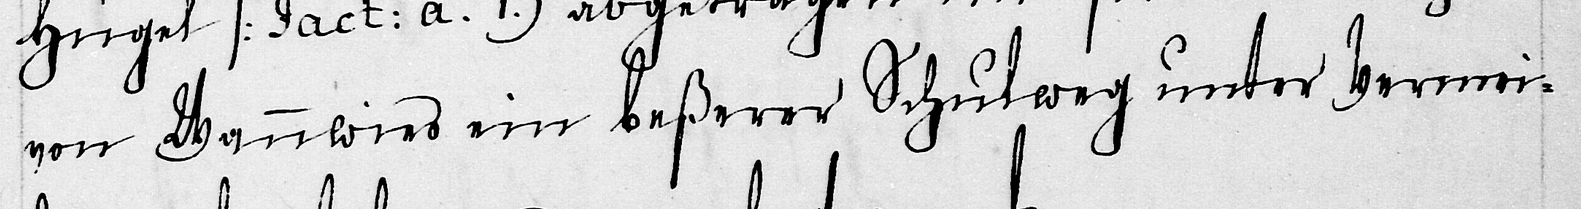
von Wannwies ein beßerer Schulweg unter Vermei¬
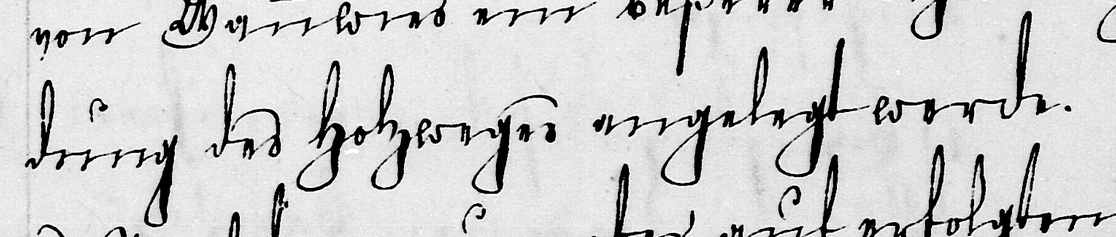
dung des Holzweges angelegt werde.
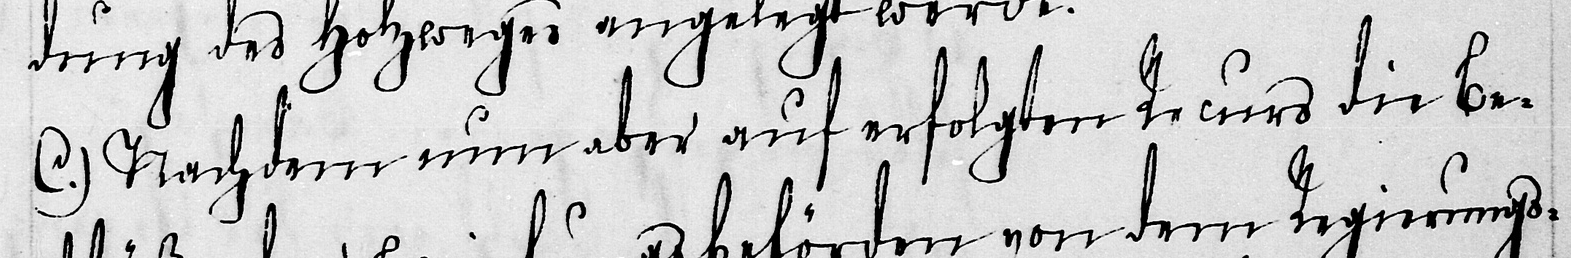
C.) Nachdem nun aber auf erfolgten Recurs die Be¬
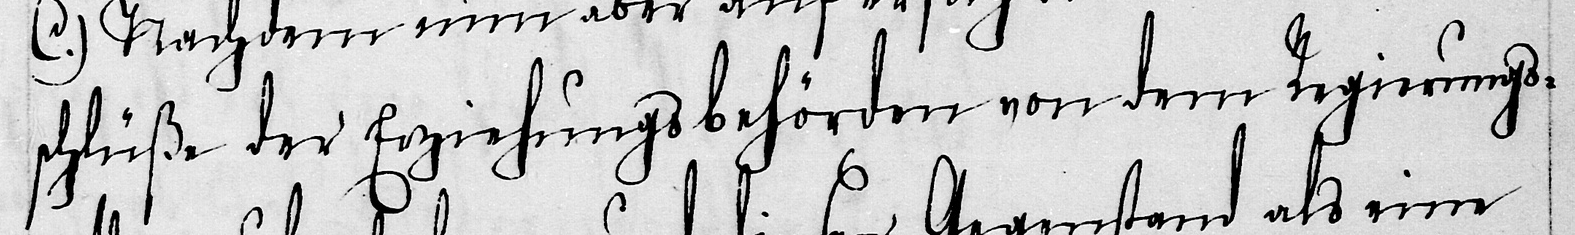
schlüße der Erziehungsbehörden von dem Regierungs¬
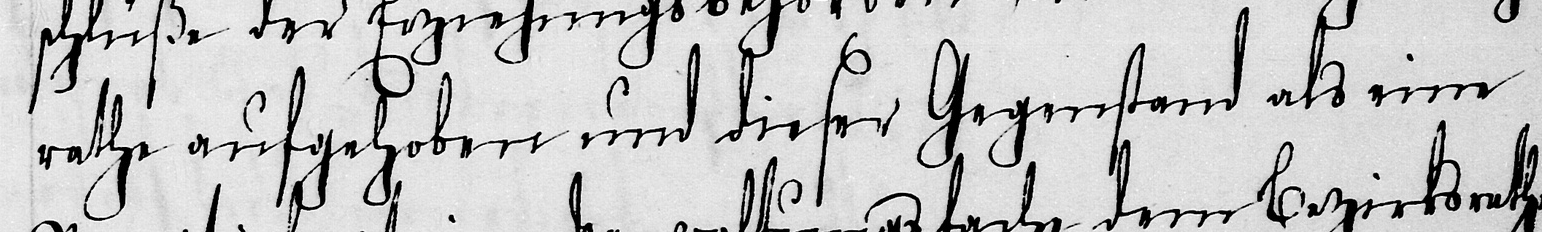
rathe aufgehoben und dieser Gegenstand als eine
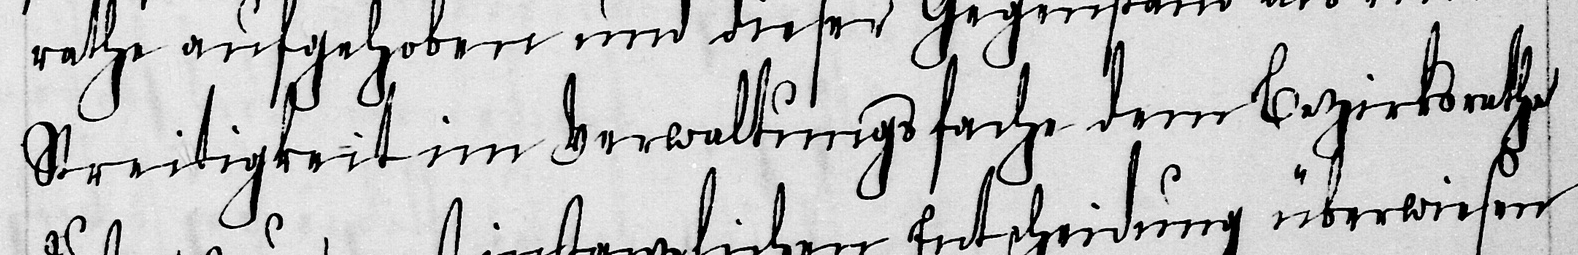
Streitigkeit im Verwaltungsfache dem Bezirksrathe
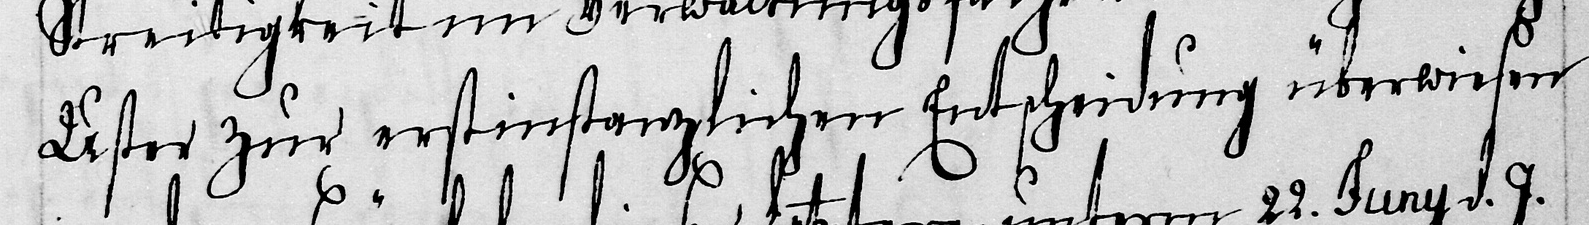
Uster zur erstinstanzlichen Entscheidung überwiesen
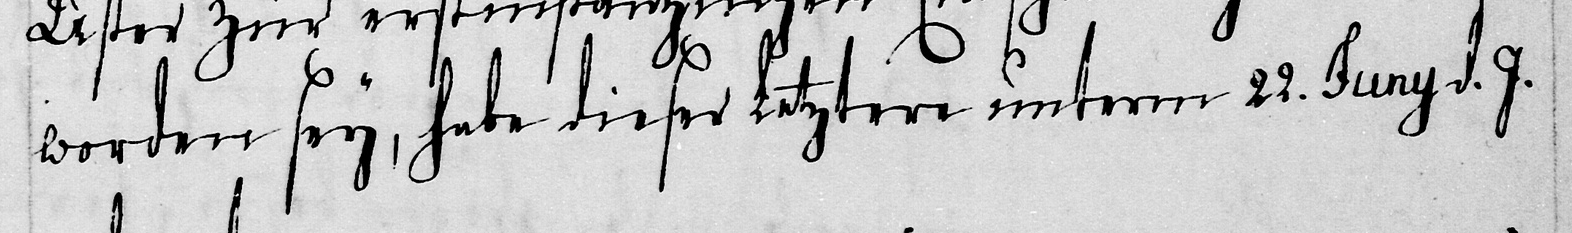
worden sey, habe dieser Letztere unterm 22. Juny d. J.
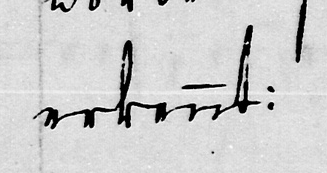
erkennt:
